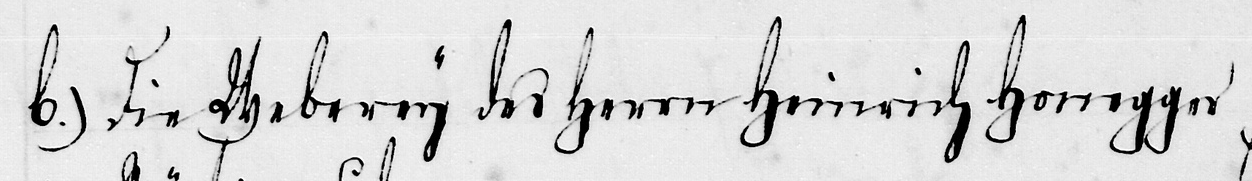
b.) Die Weberey des Herrn Heinrich Honegger
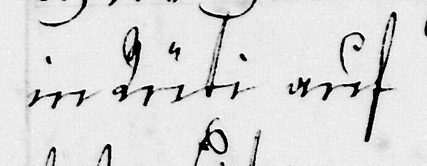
in Rüti auf
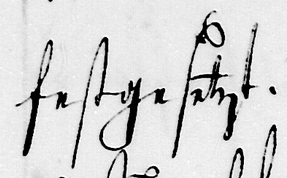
festgesetz¬
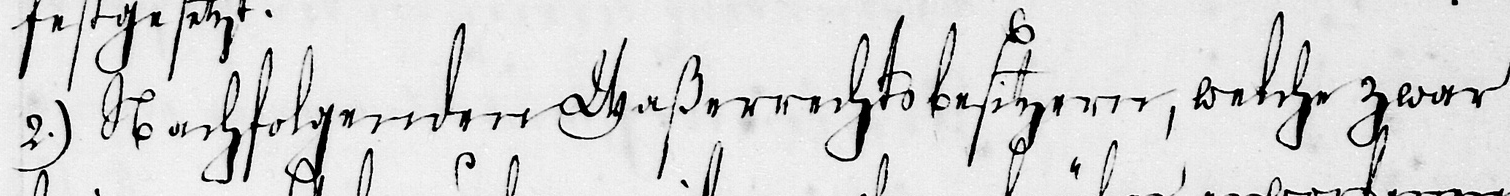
2.) Nachfolgenden Waßerrechtsbesitzern, welche zwar
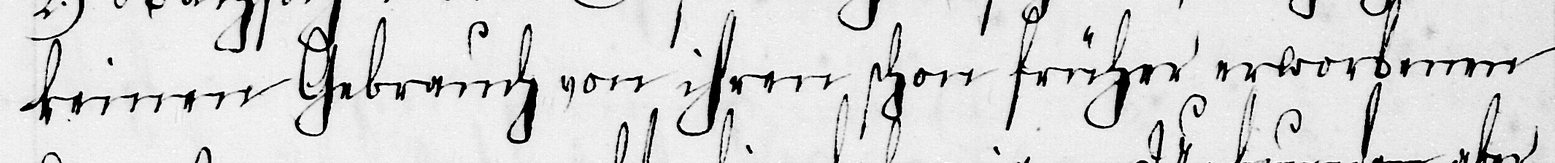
keinen Gebrauch von ihren schon früher erworbenen
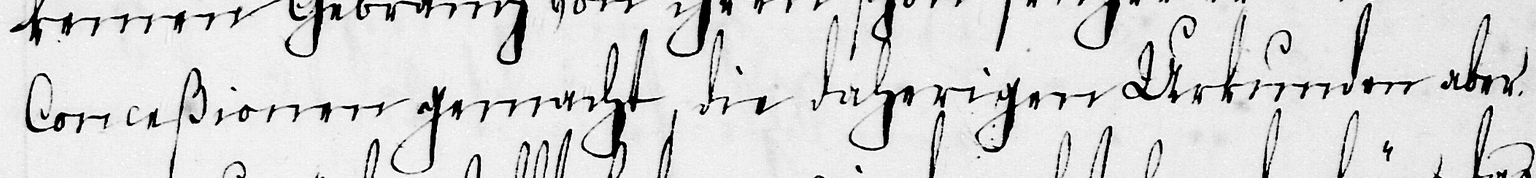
Conceßionen gemacht, die daherigen Urkunden aber
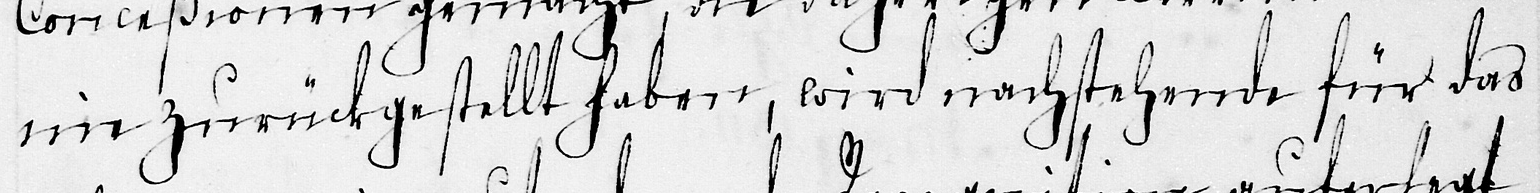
nie zurückgestellt haben, wird nachstehende für das
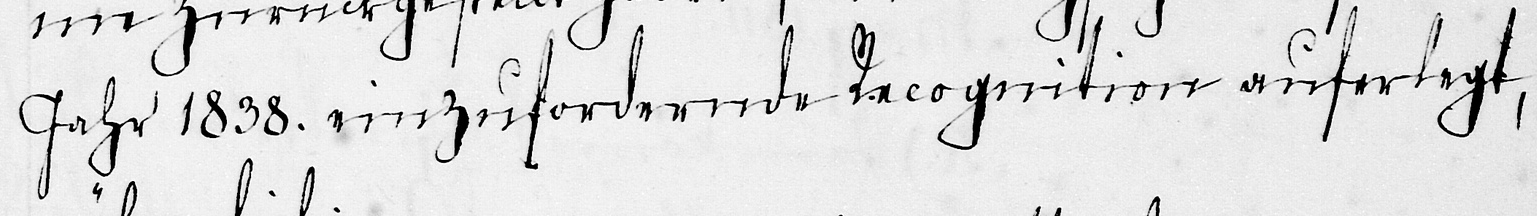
Jahr 1838. einzufordernde Recognition auferlegt,
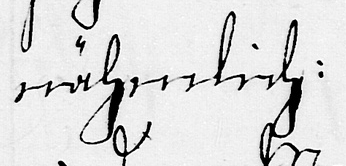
nähmlich:
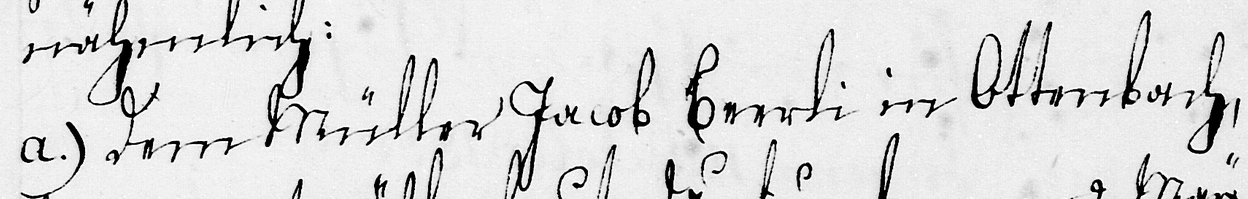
a.) Dem Müller Jacob Beerli in Ottenbach,
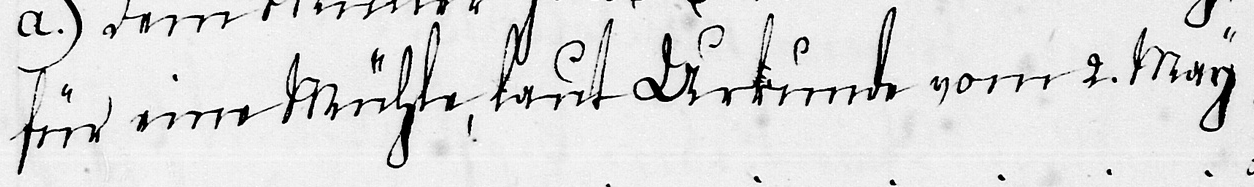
für eine Mühle, laut Urkunde vom 2. März
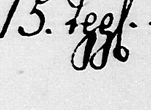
10.
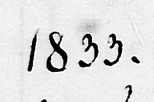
1833.
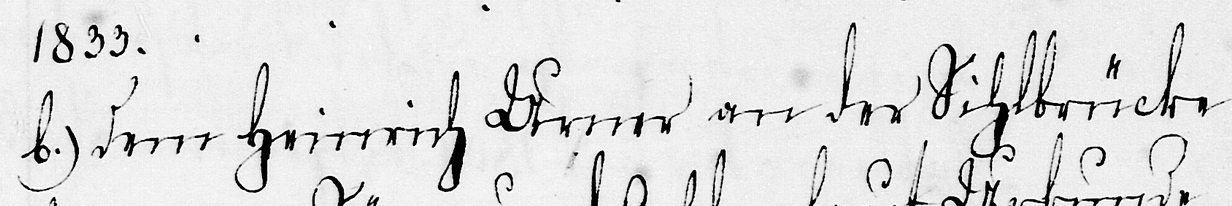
b.) Dem Heinrich Urner an der Sihlbrücke
